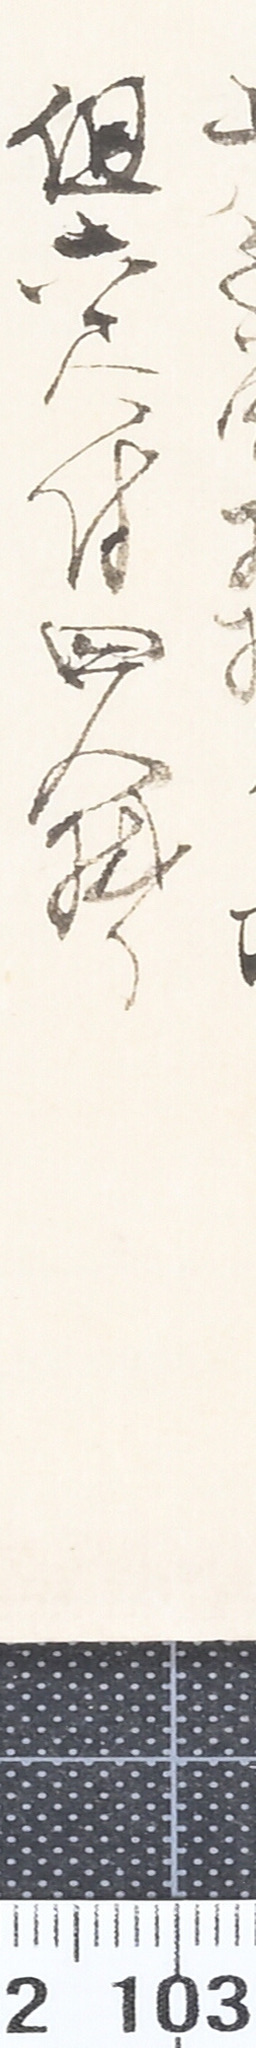但六尺ニ付六人掛り
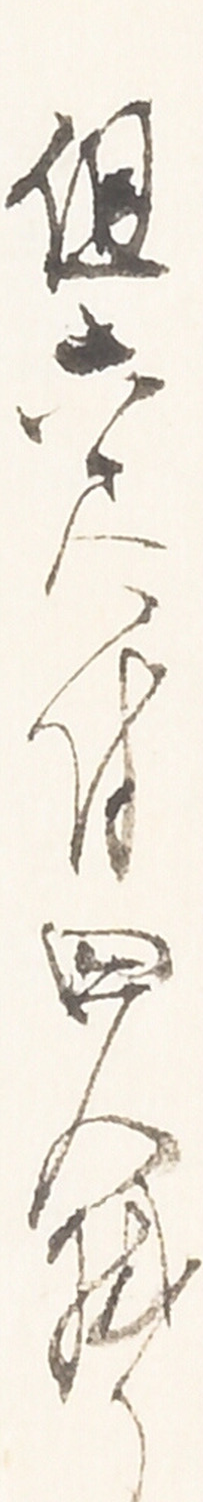但六尺ニ付六人掛り
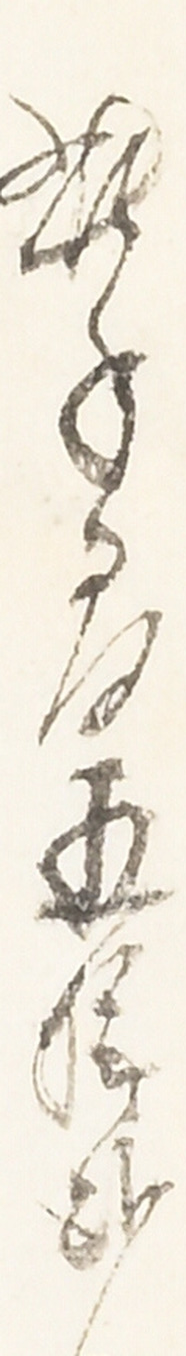此手間七拾六人
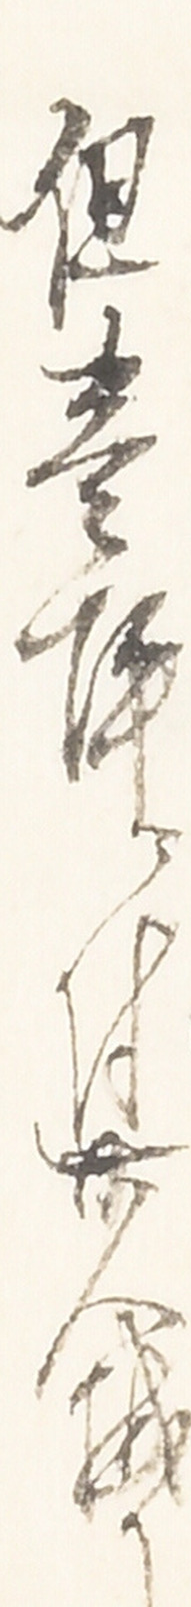但壱坪ニ付六人掛り
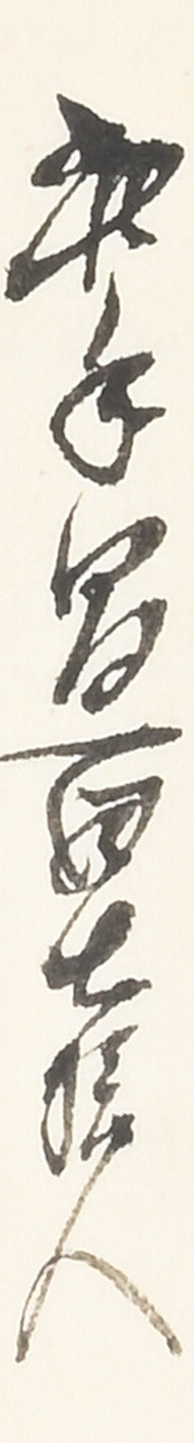此手間百七拾人
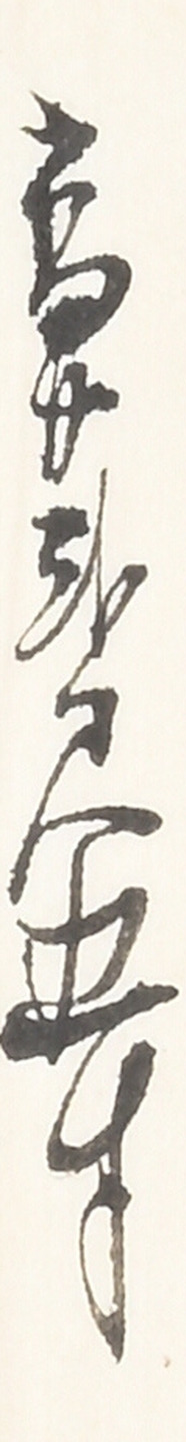高サ弐尺五寸
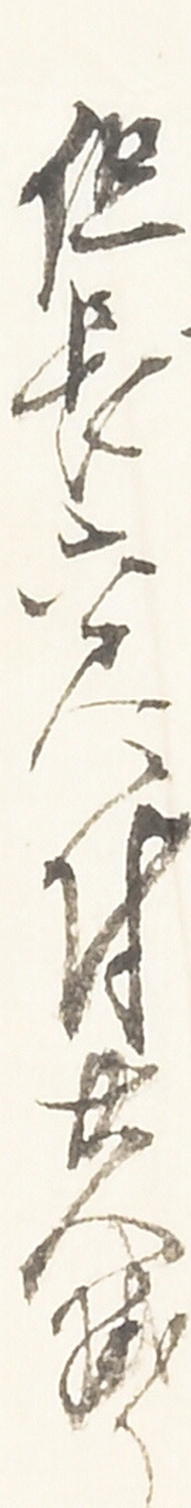但長六尺ニ付廿人掛り
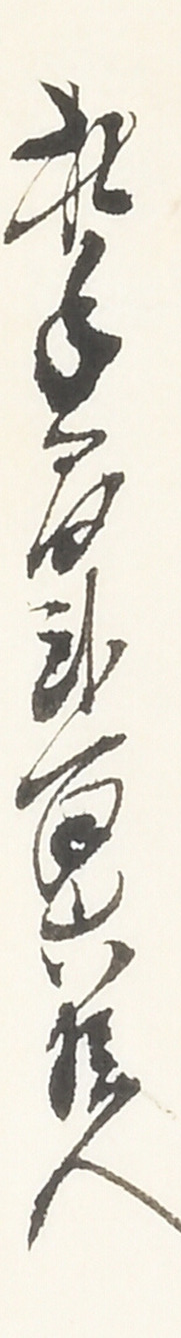此手間弐百六拾人
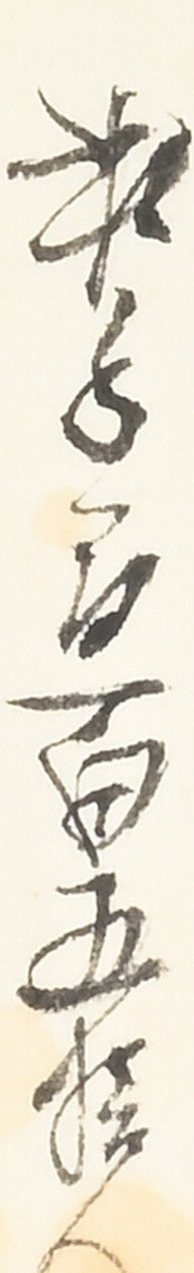此手間百五拾人

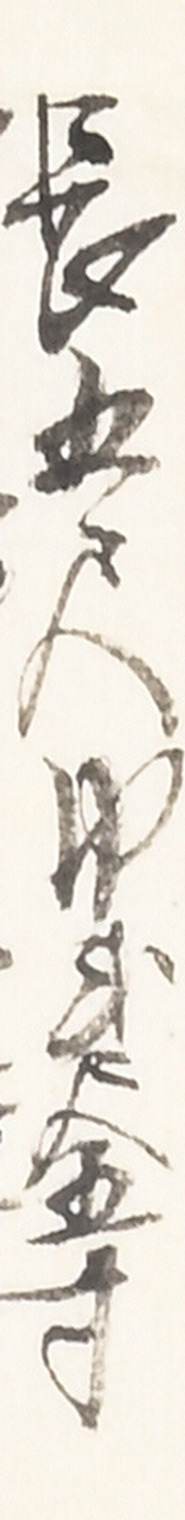長五尺巾弐尺五寸
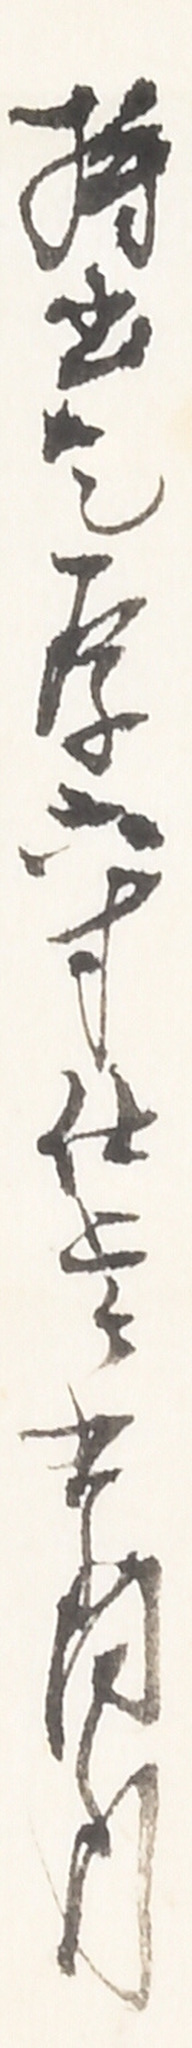持出シ厚六寸仕上ケ右同断
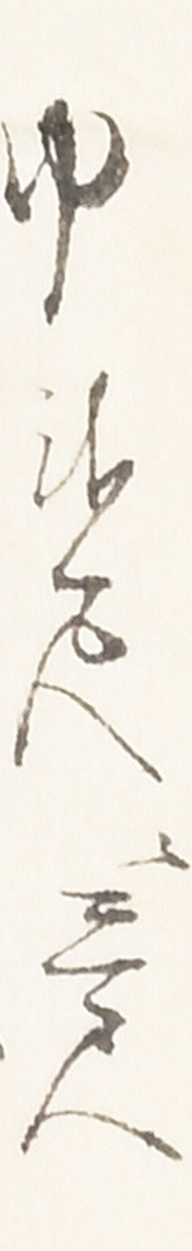巾弐尺ニ三尺
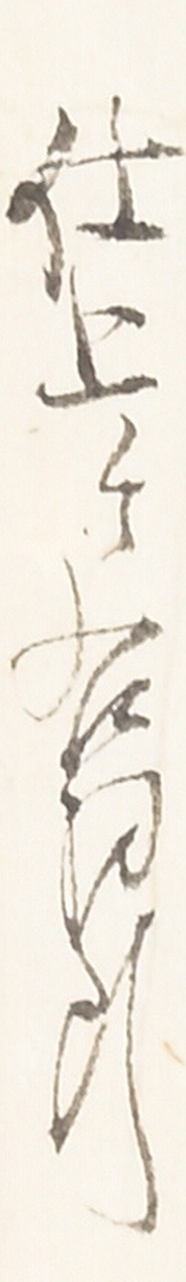仕上ヶ右同断
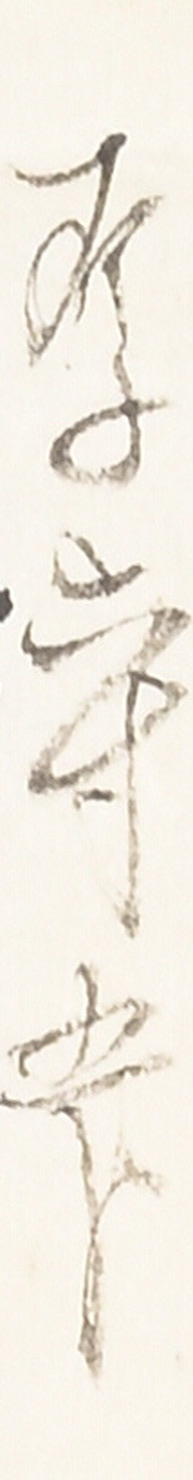巾五寸五分
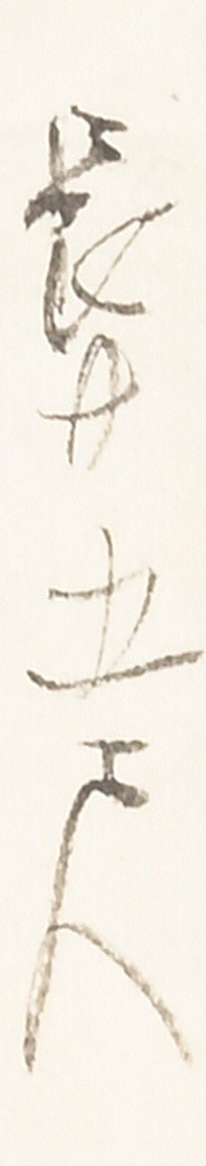長サ五尺
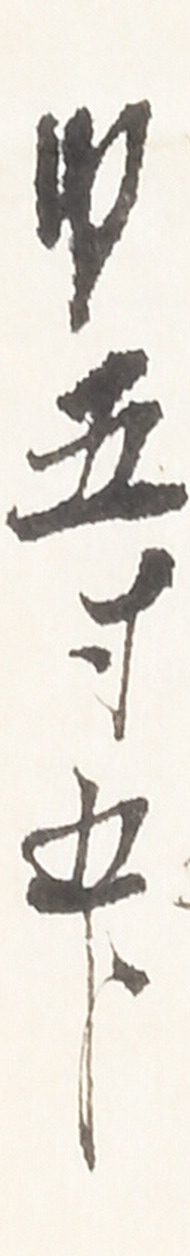巾五寸五分
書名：天保十一年四月十六日岩窪御廟御普請仕様帳扣
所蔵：伊那市立高遠町図書館・合同会社AMANE
